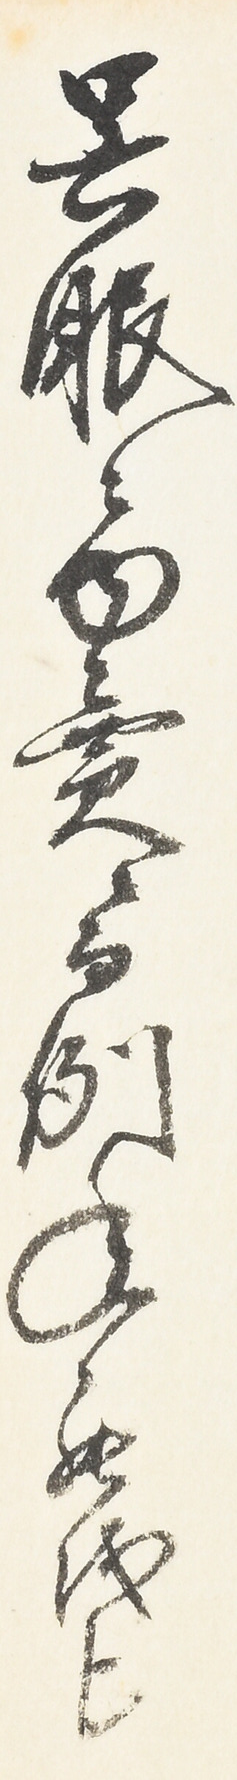呉服商売ニ而例年罷越申候
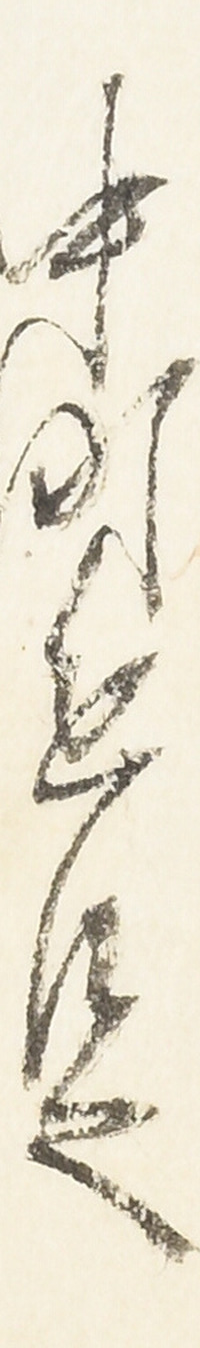中町近江や
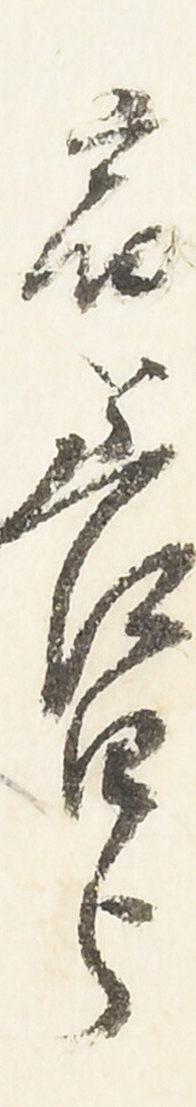宿善四郎
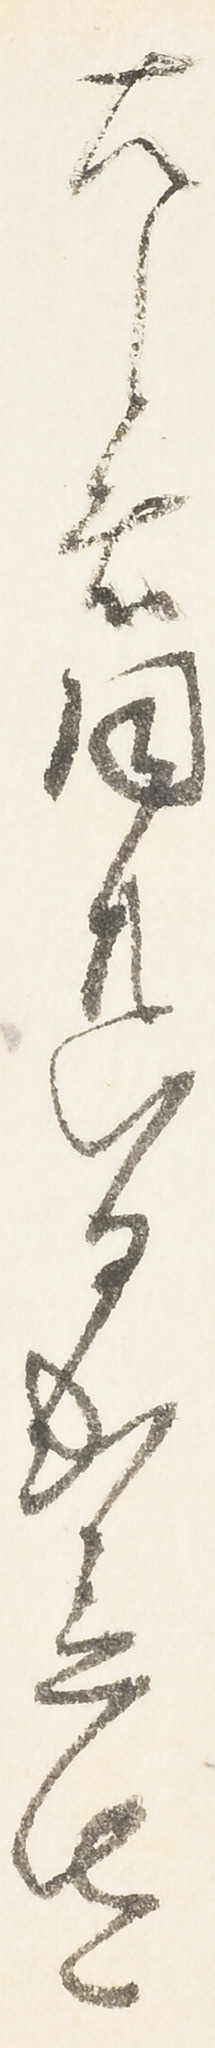右之者同廿八日出立仕候
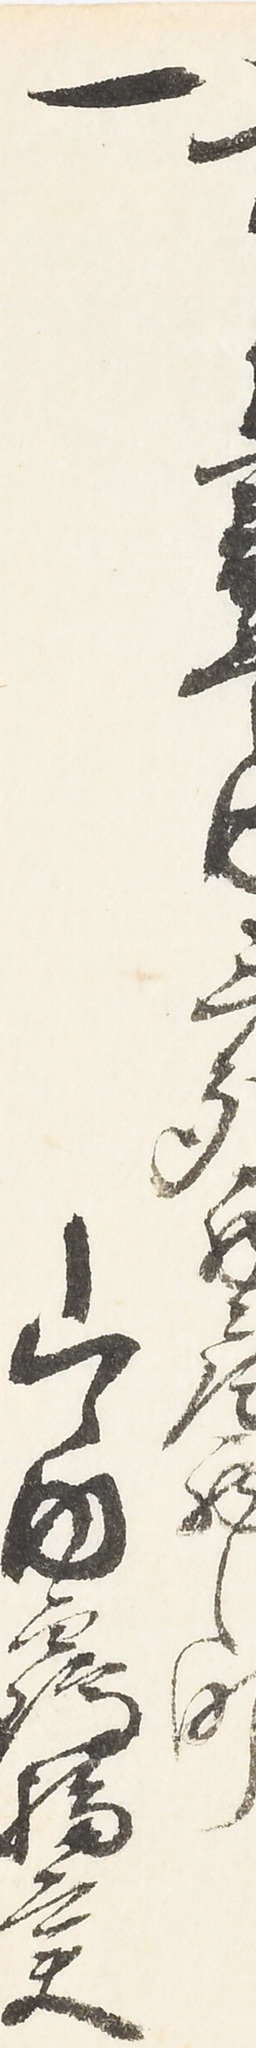一山之内鶴福太夫
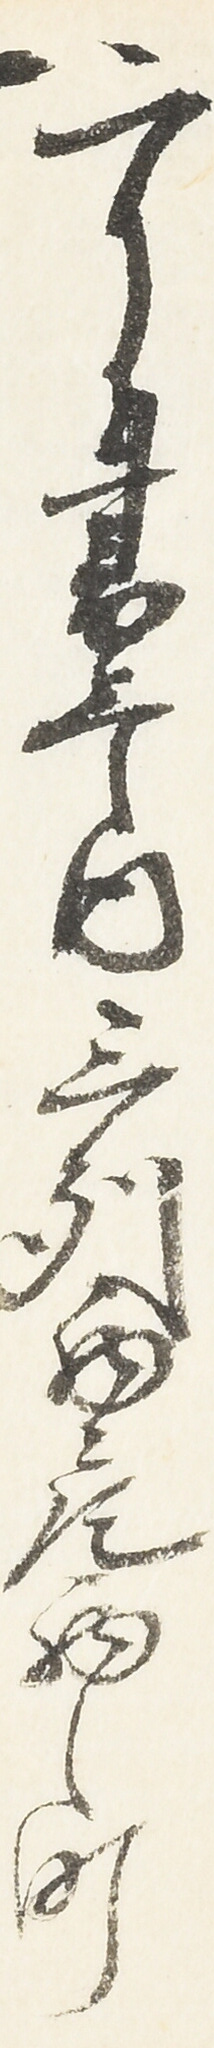二月書上之内三州西尾西之町
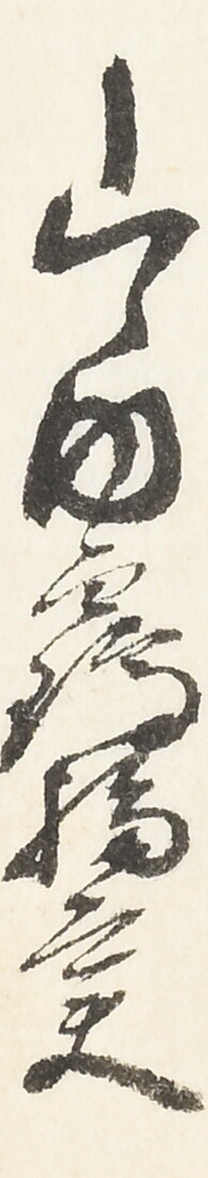一山之内鶴福太夫
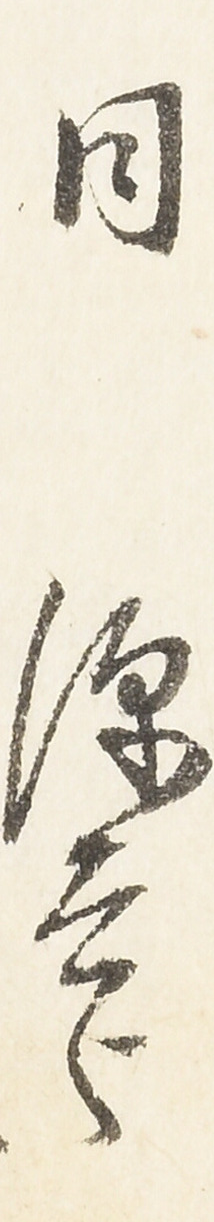同源太郎
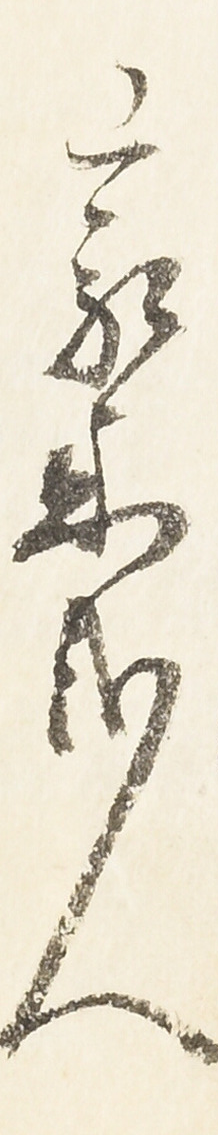家来弐人
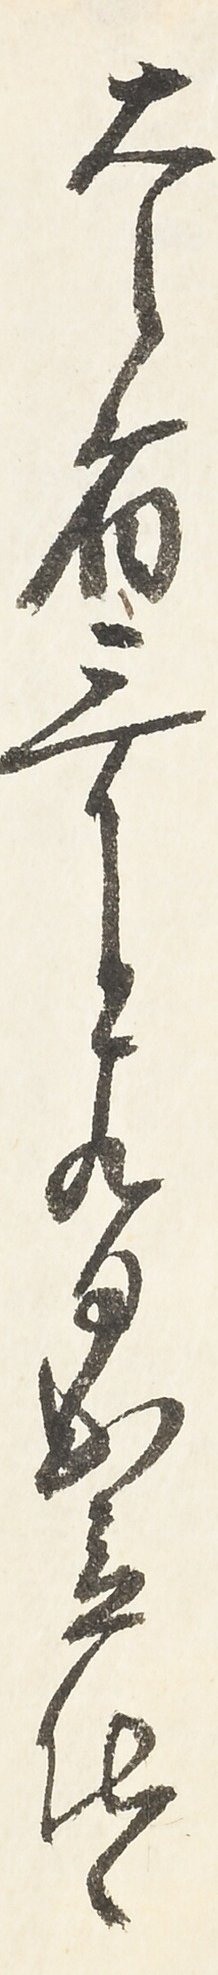右之者三月十九日出立仕候
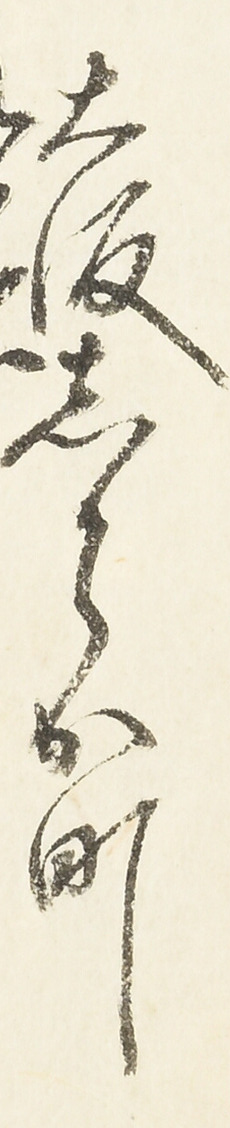大坂しらか町
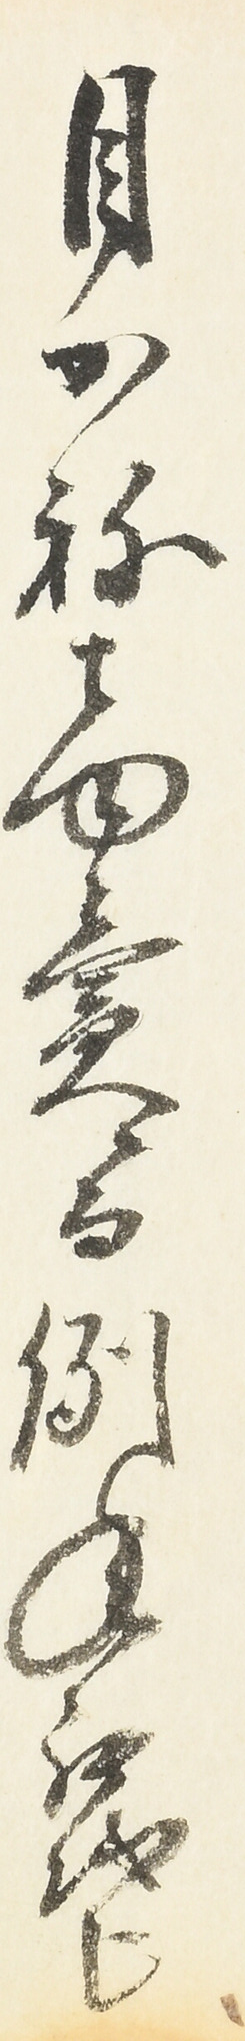めかね商売ニ而例年罷越申候
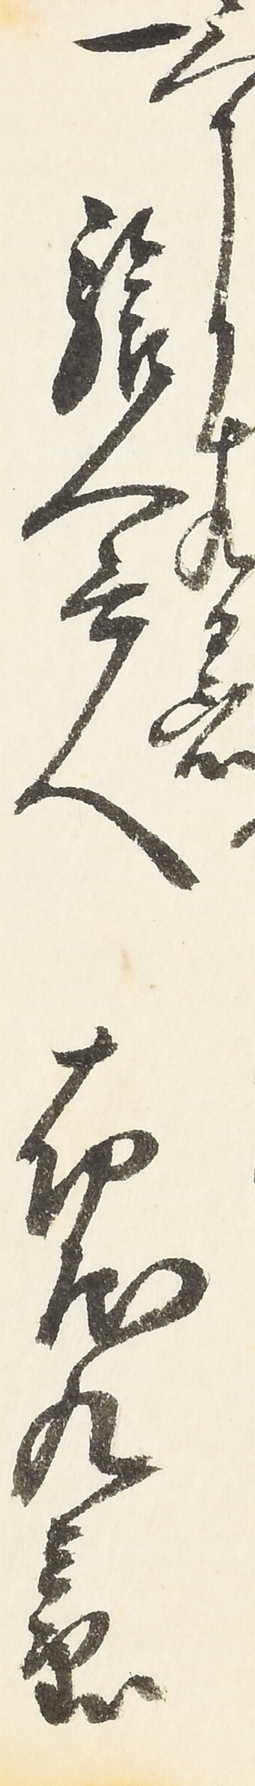一旅人壱人布屋九兵衛
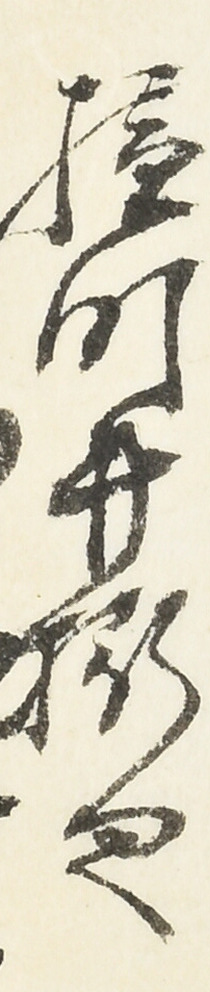横町井桁や
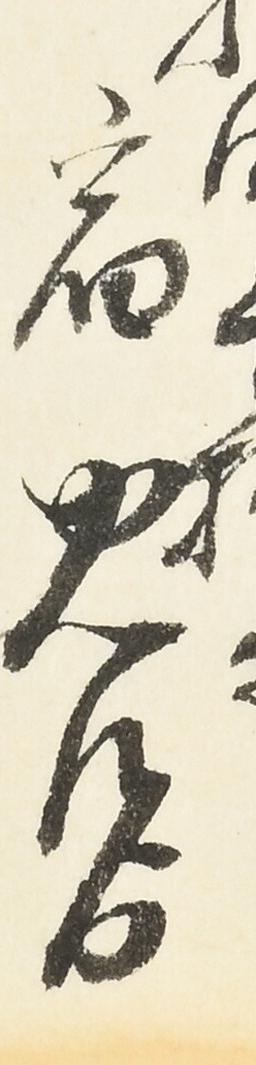宿忠左衛門
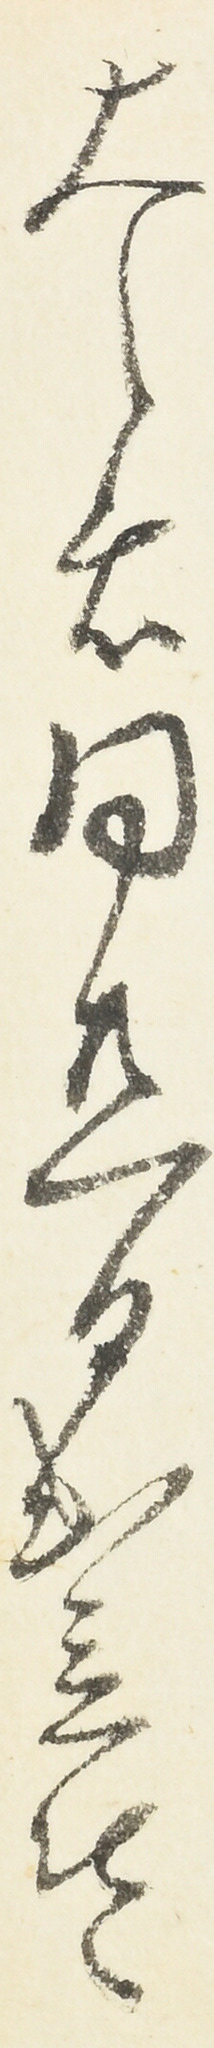右之者同廿一日出立仕候
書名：町中旅人泊控帳
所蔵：伊那市立高遠町図書館・合同会社AMANE
